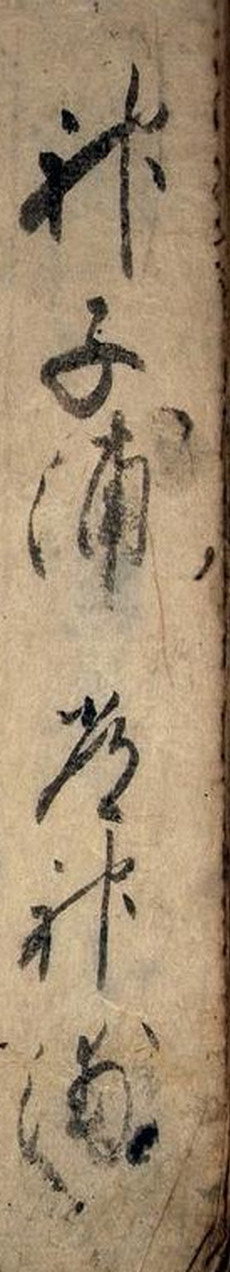神子浦常神浦
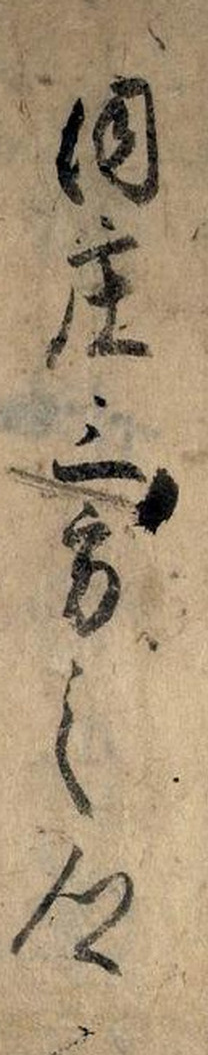同庄三方之郷
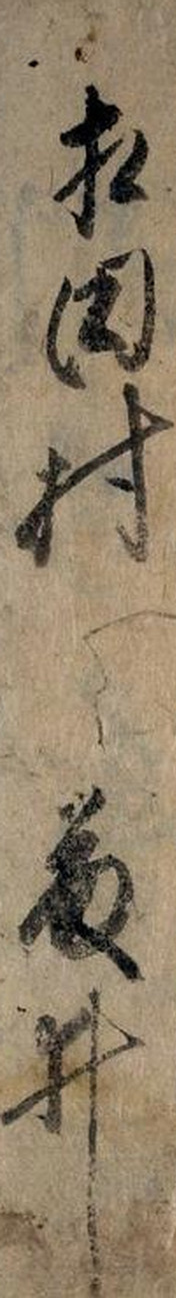相田村藤井
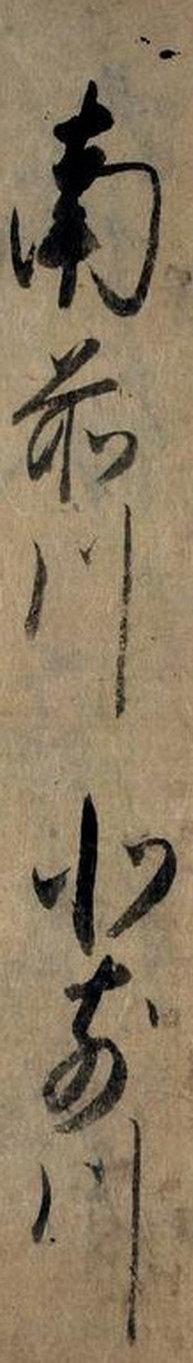南前川北前川
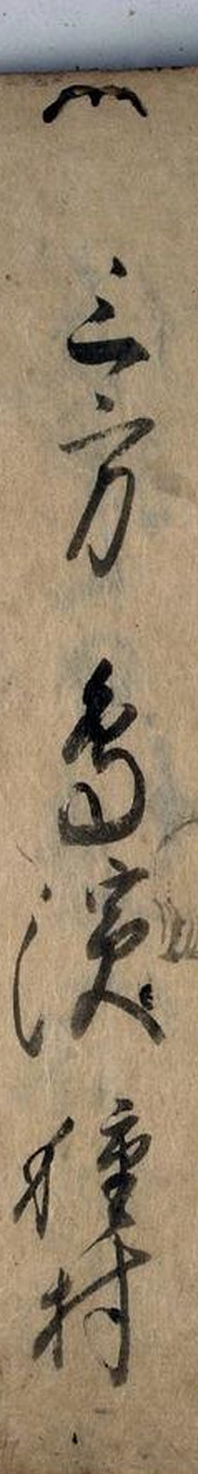三方鳥浜種村
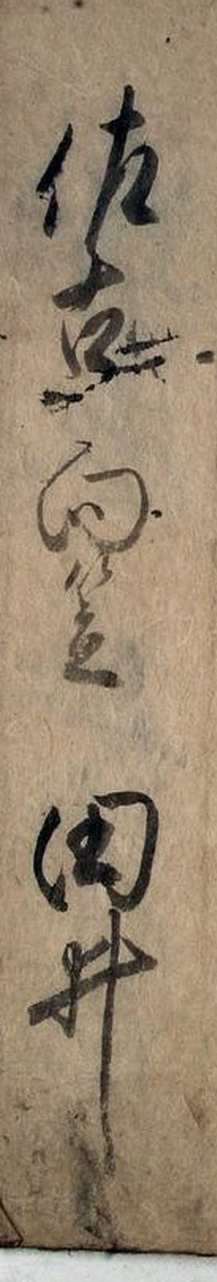佐古向笠田井

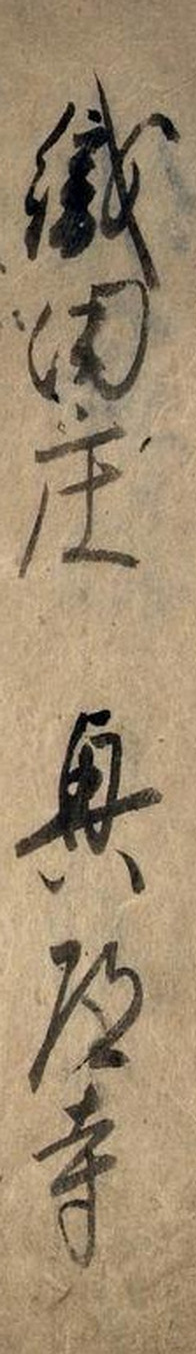織田庄興道寺
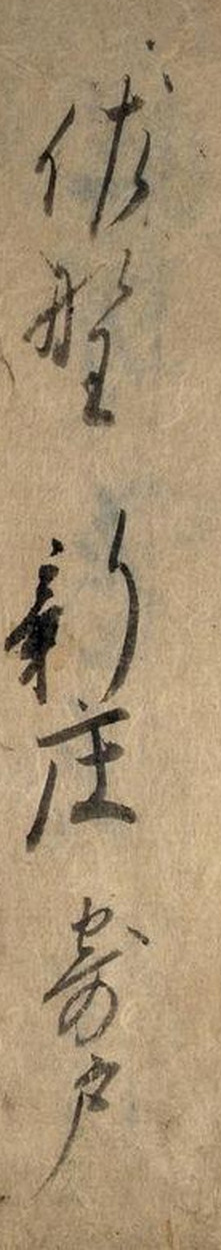佐野新庄寄戸
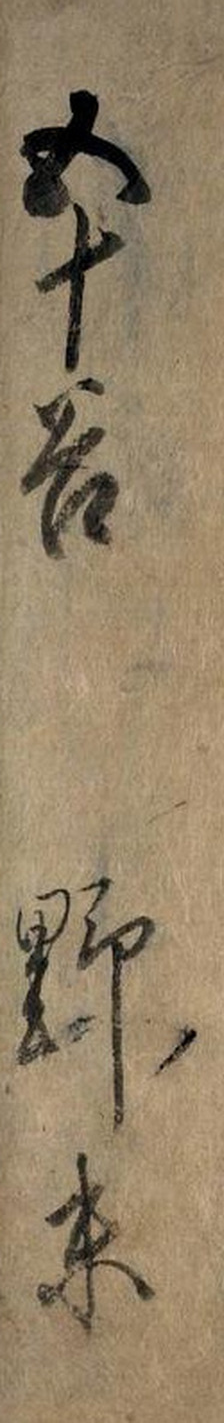五十谷野末
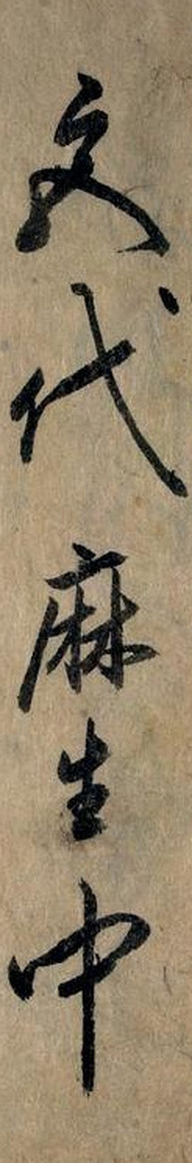宮代麻生中
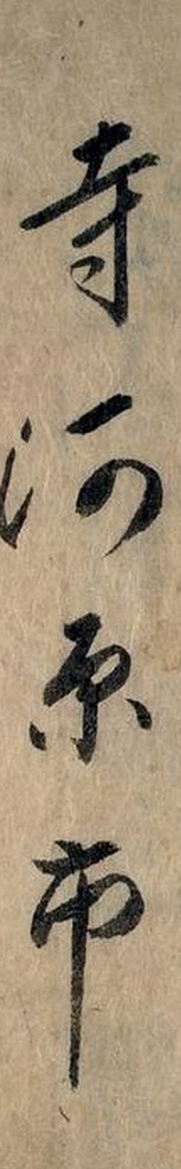寺河原市
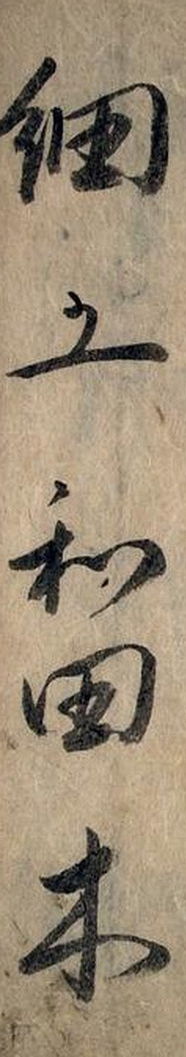細工和田木

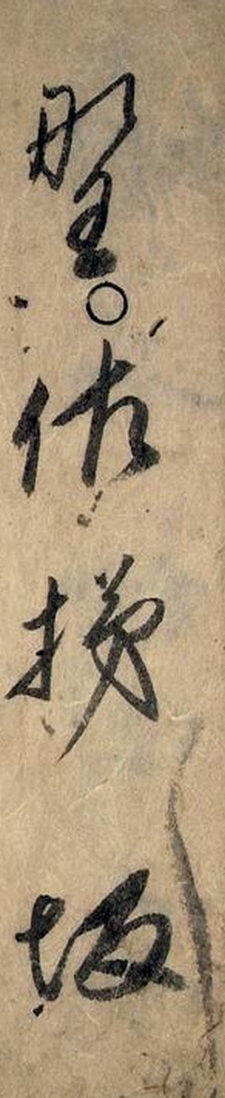野佐柿坂
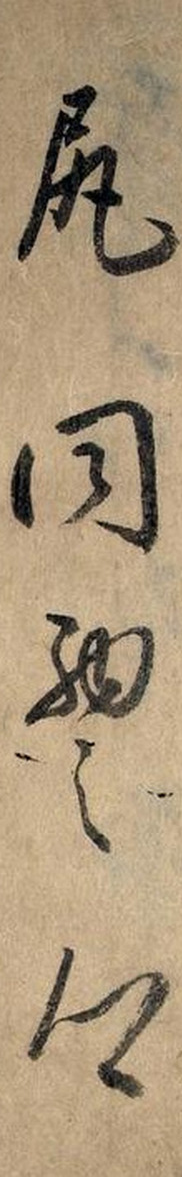尻同西之郷
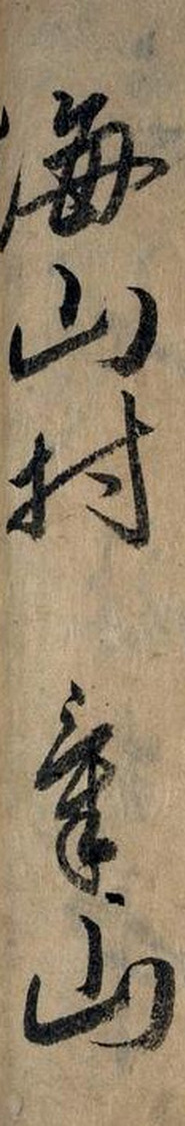海山村気山
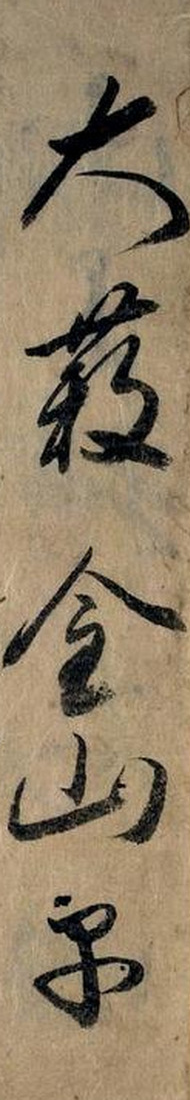大藪金山早
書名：御手本（手習、家号之事、小浜商家の屋号）
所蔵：福井県文書館 Fukui Prefectural Archives
